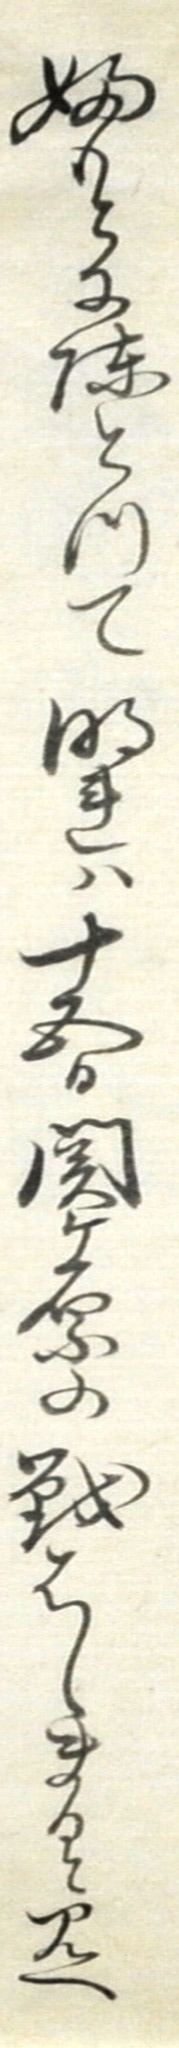ふもとに陣とつて明れは十五日関ヶ原の戦はしまると見へ
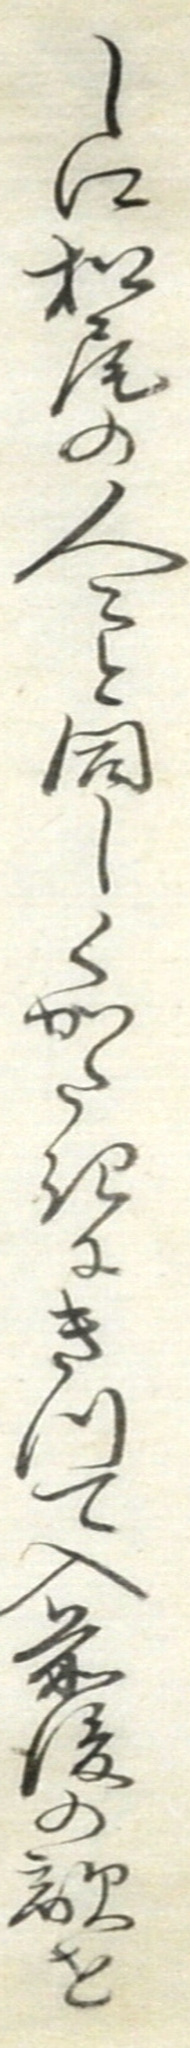しに松尾の人々と同しくかたきにきつて入前後の敵を
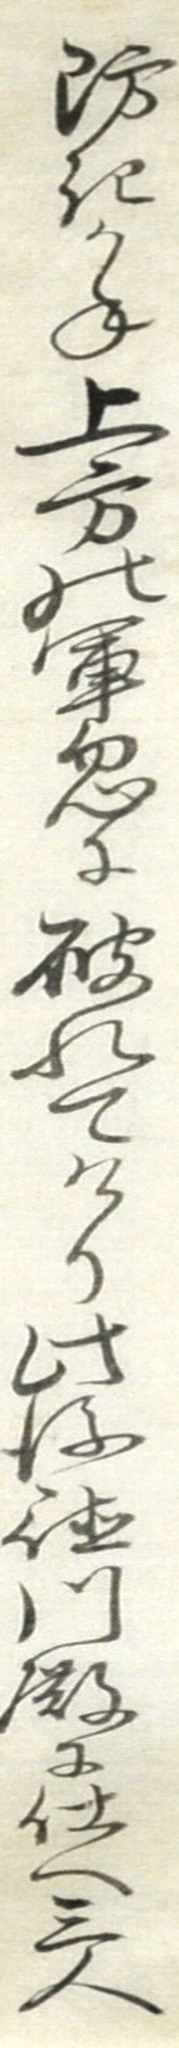防きかね上方の軍忽に破れてけり此後徳川殿に仕へ三人
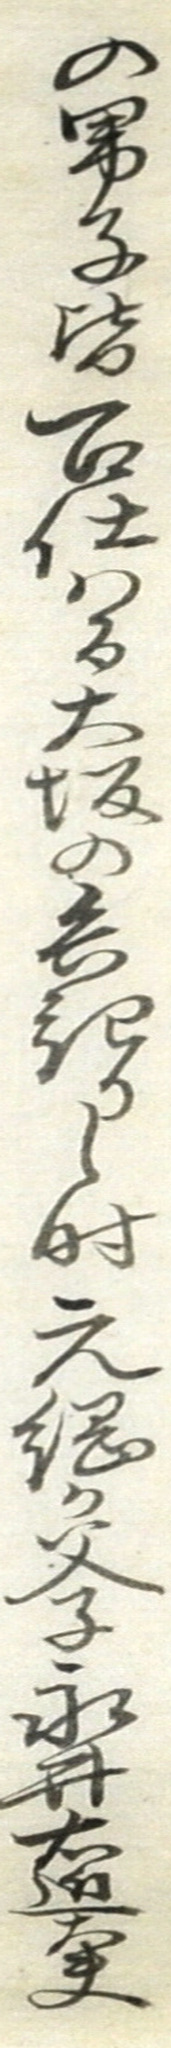の男子皆召仕はる大坂の兵起りし時元網か父子永井右近大夫
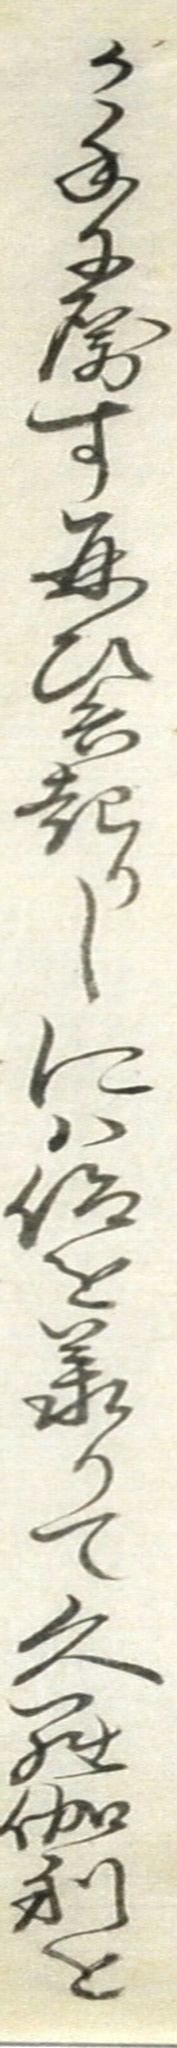か手に属す再ひ兵起りしには仰を承りて久羅伽利を
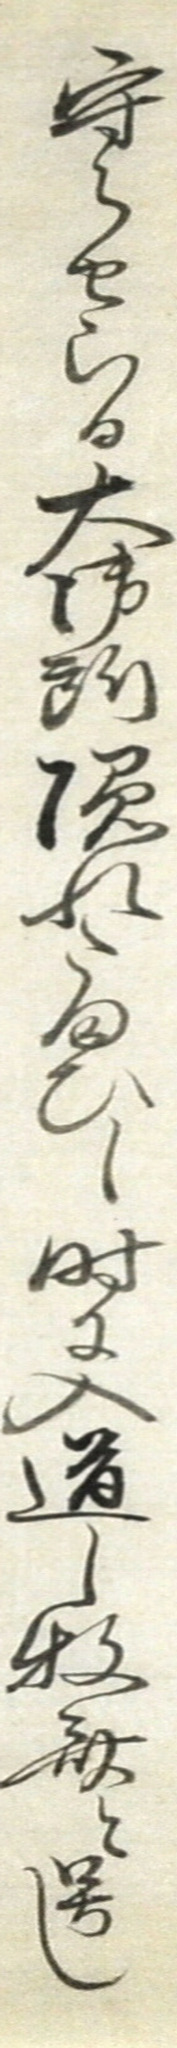守らせらる大御所隠れたまひし時に入道し牧斎と号し
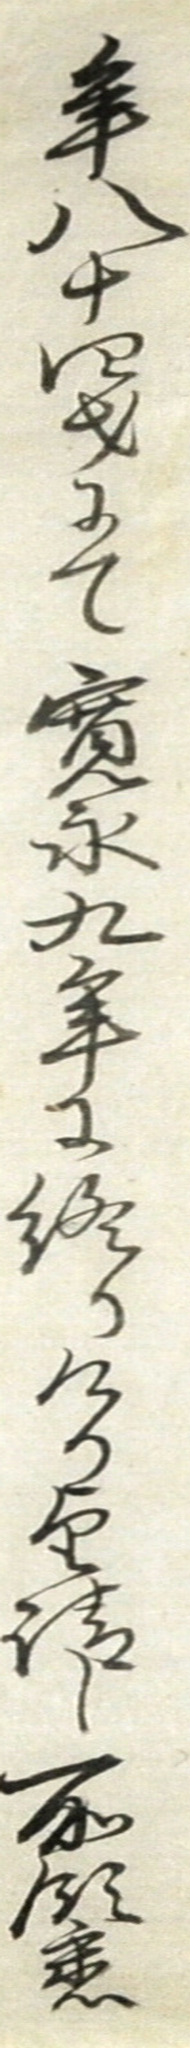年八十四才にて寛永九年に終りけり望請し所領悉
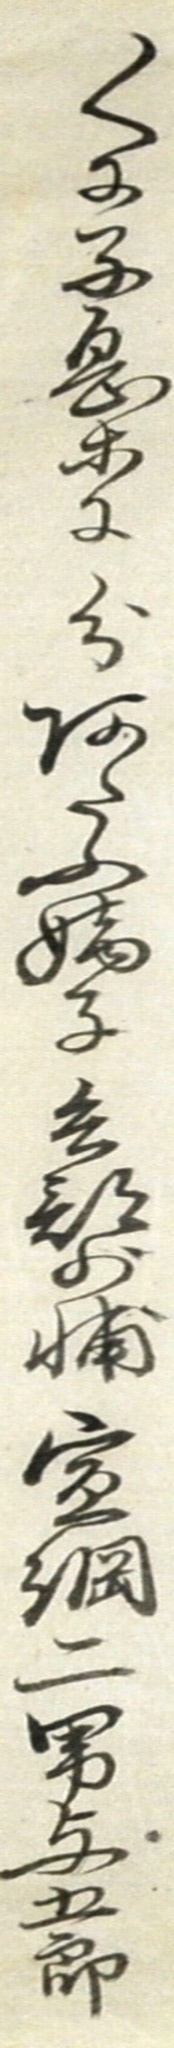くに子息等に分あたふ嫡子兵部少輔宣綱二男与五郎
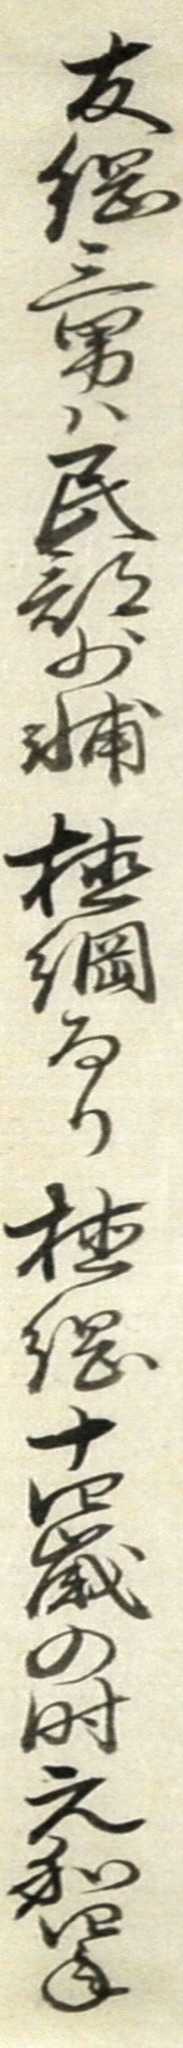友綱三男は民部少輔植綱なり植綱十四歳の時元和四年
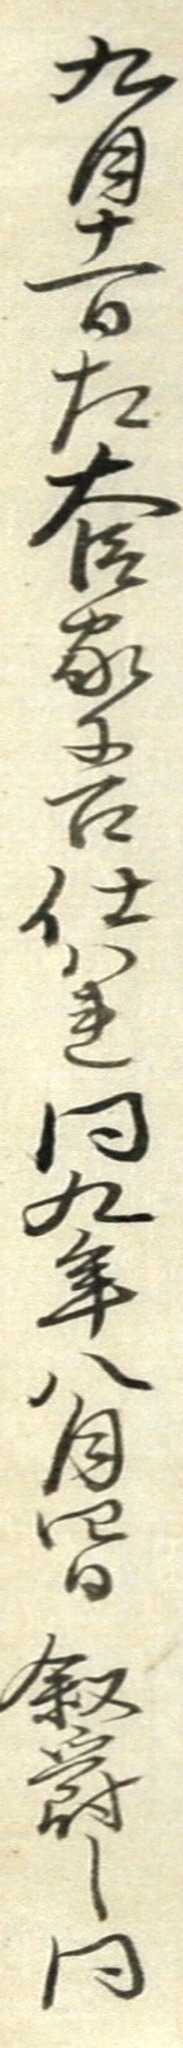九月十一日左大臣家に召仕はれ同九年八月四日叙爵し同

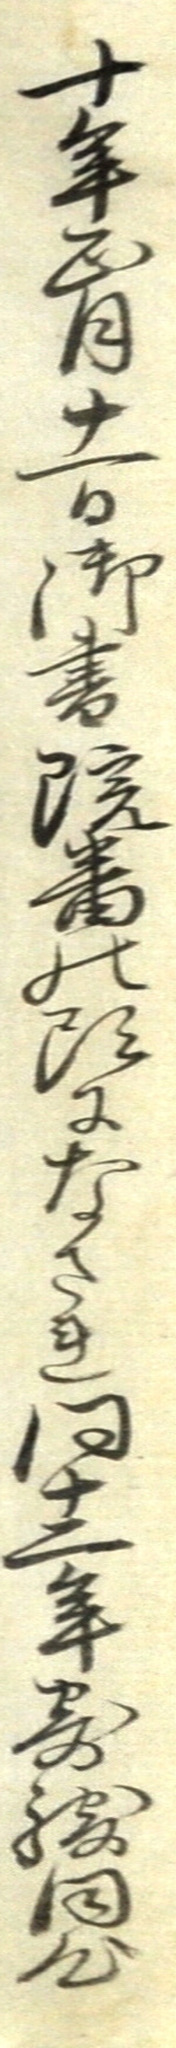十年正月十一日御書院番の頭になされ同十二年寄騎同心
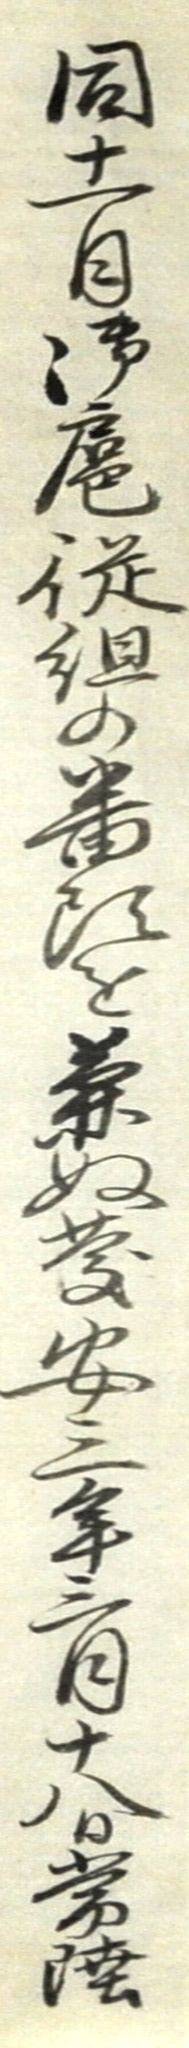同十一月御扈従組の番頭を兼ぬ慶安三年三月十八日常陸
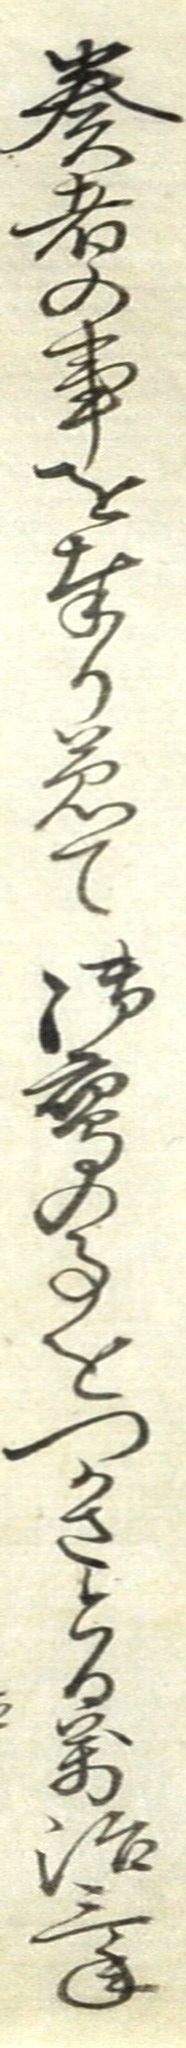奏者の事を奉り兼て御鷹の事をつかさとる万治三年
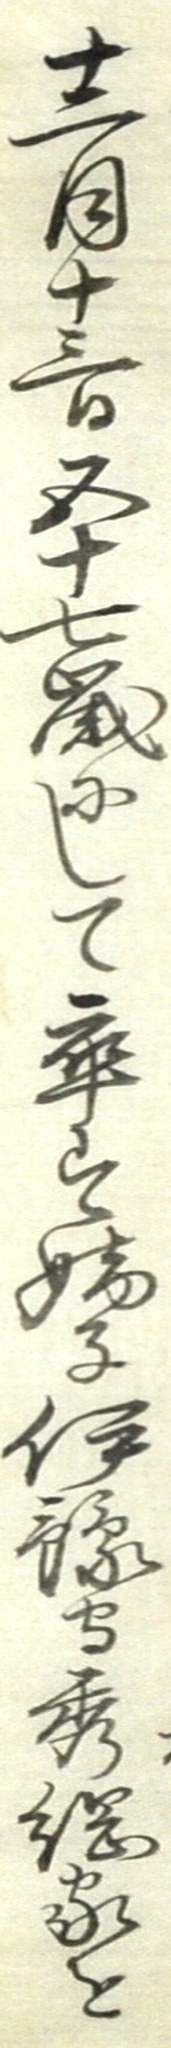十二月十三日五十七歳にして卒す嫡子伊予守秀綱家を
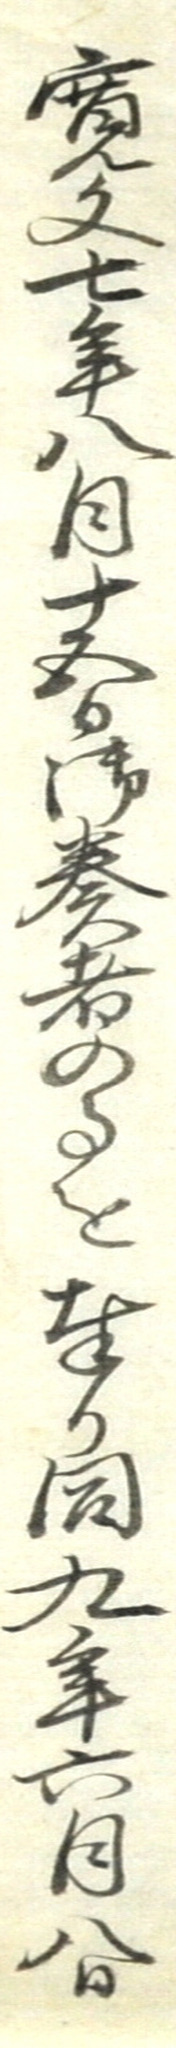寛文七年八月十五日御奏者の事を奉り同九年六月八日
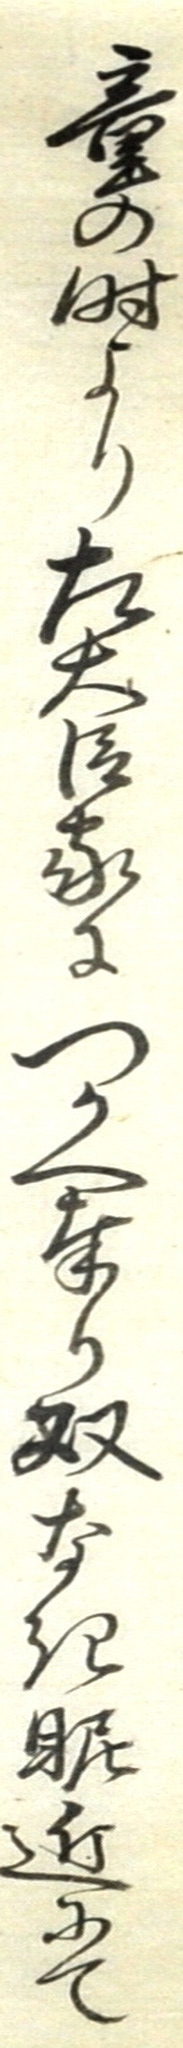童の時より左大臣家につかへ奉り双なき昵近にて
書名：藩翰譜（六）
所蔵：伊那市立高遠町図書館・合同会社AMANE
